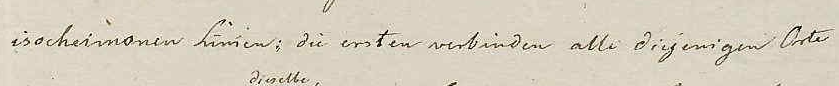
isocheimonen Linien: die ersten verbinden alle diejenigen Orte
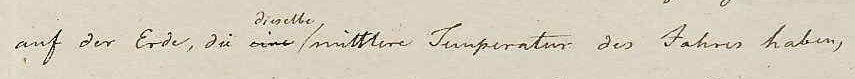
auf der Erde, die einedieselbe mittlere Temperatur des Jahres haben,
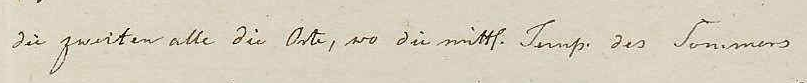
die zweiten alle die Orte, wo die mittl. Temp. des Sommers
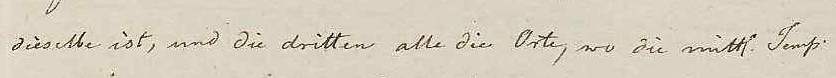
dieselbe ist, und die dritten alle die Orte, wo die mittl. Temp.
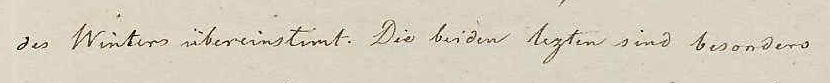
des Winters übereinstimt. Die beiden lezten sind besonders
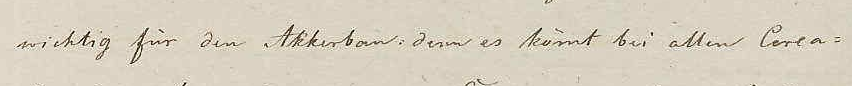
wichtig für den Akkerbau: denn es kömt bei allen Cerea-
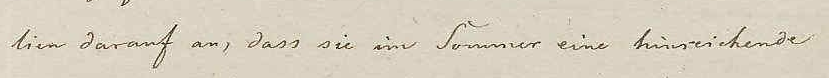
lien darauf an, dass sie im Sommer eine hinreichende
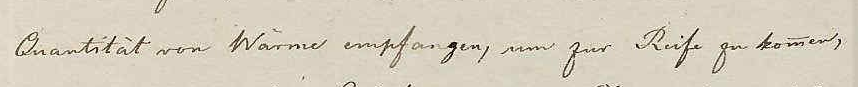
Quantität von Wärme empfangen, um zur Reife zu kom̃en,
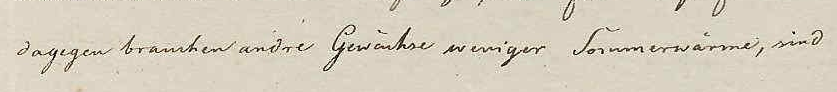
dagegen brauchen andre Gewächse weniger Sommerwärme, sind
